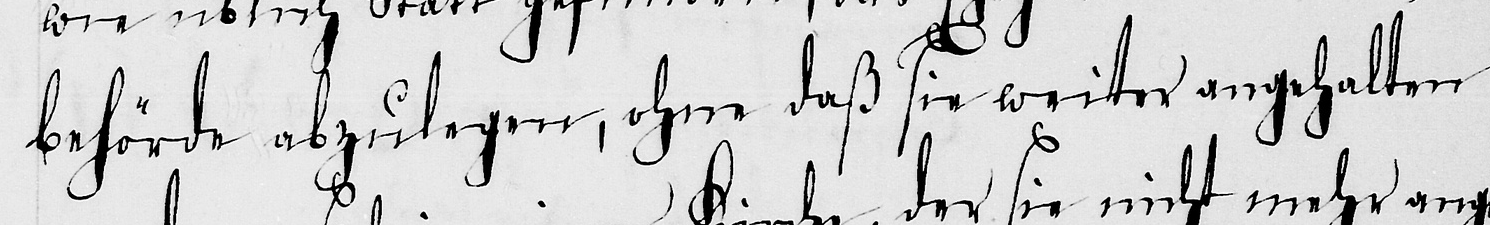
behörde abzulegen, ohne daß sie weiter angehalten
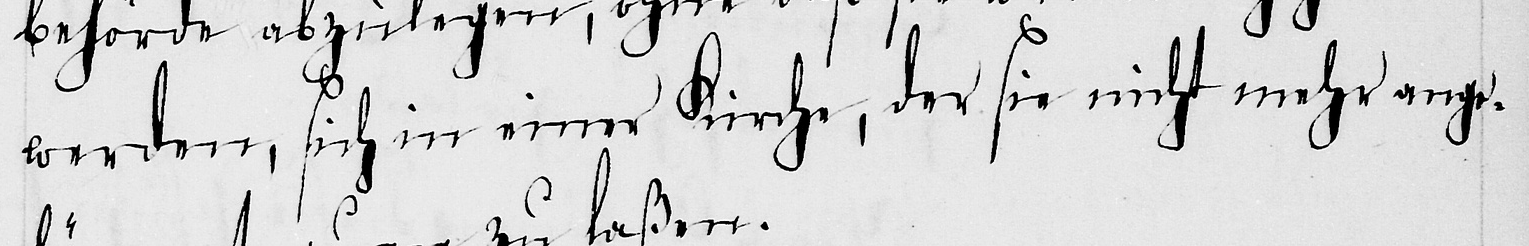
werden, sich in einer Kirche, der sie nicht mehr ange¬
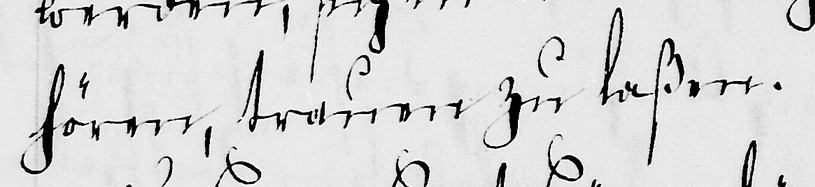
hören, trauen zu laßen.
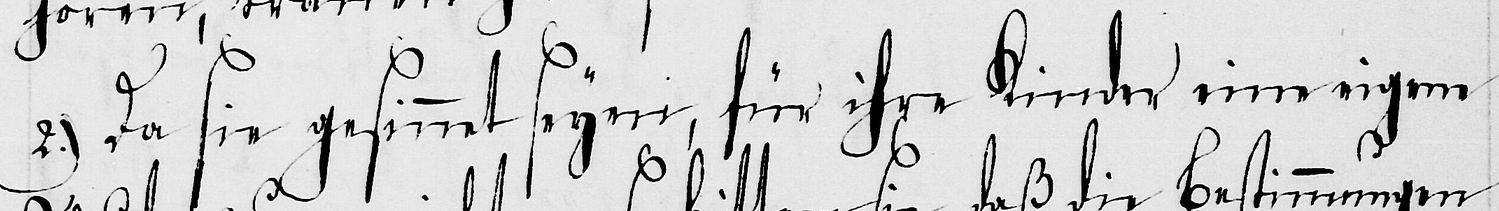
2.) Da sie gesinnet seyen, für ihre Kinder eine eigene
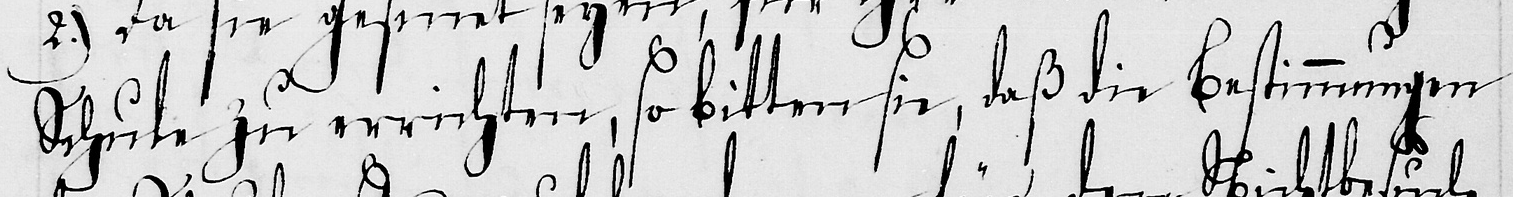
Schule zu errichten, so bitten sie, daß die Bestimmungen
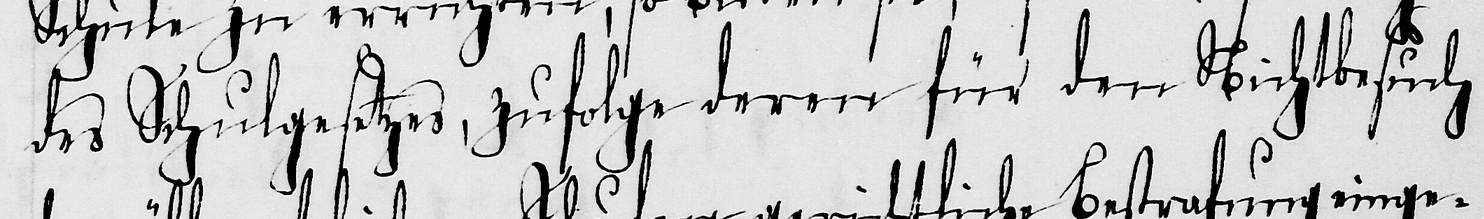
des Schulgesetzes, zufolge deren für den Nichtbesuch
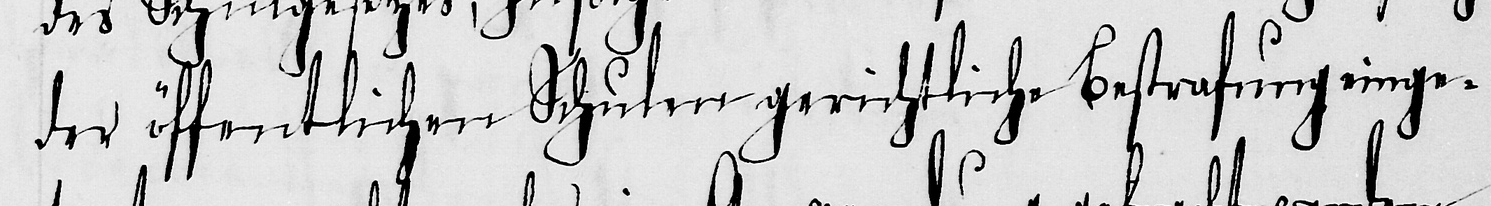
der öffentlichen Schulen gerichtliche Bestrafung einge¬
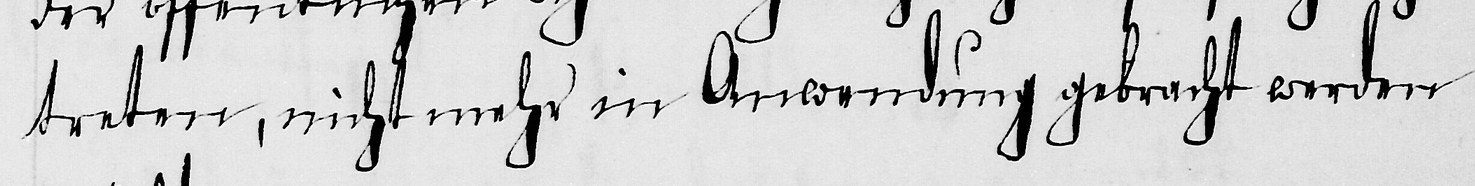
treten, nicht mehr in Anwendung gebracht werden
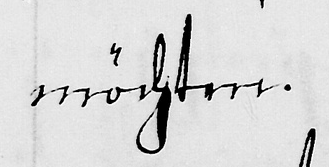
möchten.
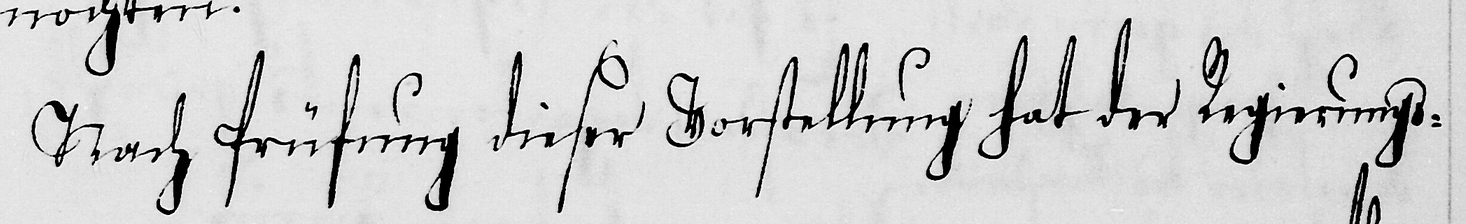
Nach Prüfung dieser Vorstellung hat der Regierungs-
